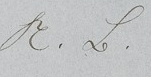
N. B.
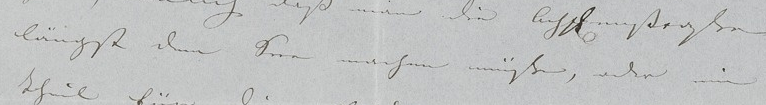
längst dem See machen müße, oder ein
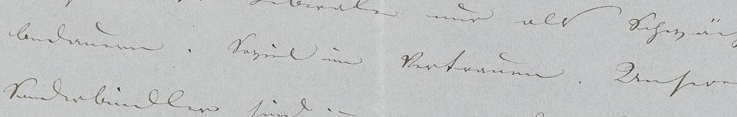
bedauern. Soviel im Vertrauen. Unsere
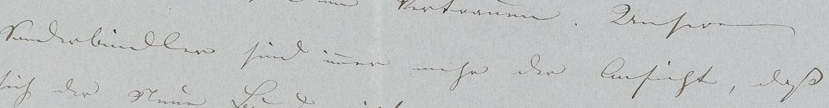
Sonderbündler sind immer mehr der Ansicht, daß
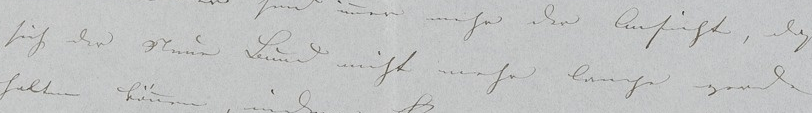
sich der Neue Bund nicht mehr lange werde
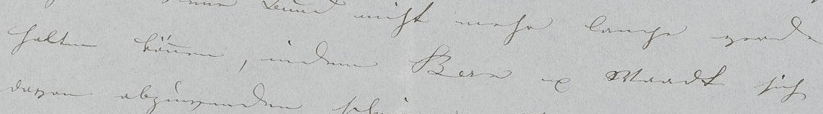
halten können, indem Bern & Waadt sich
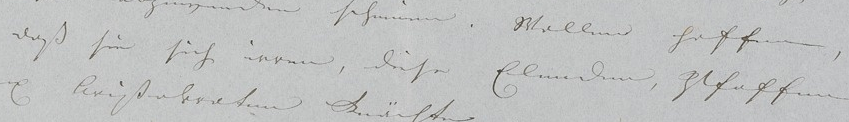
daß sie sich irren, diese Elenden, Pfaffen
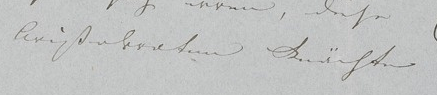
Aristokraten Knächte. –
